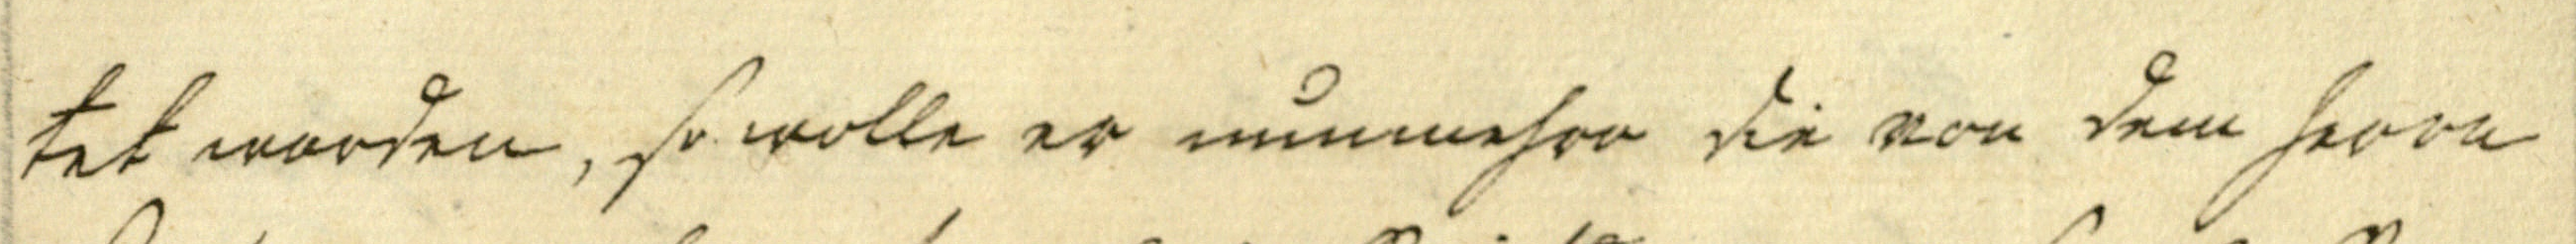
tet worden, so wolle er nunmehro die von dem Herrn
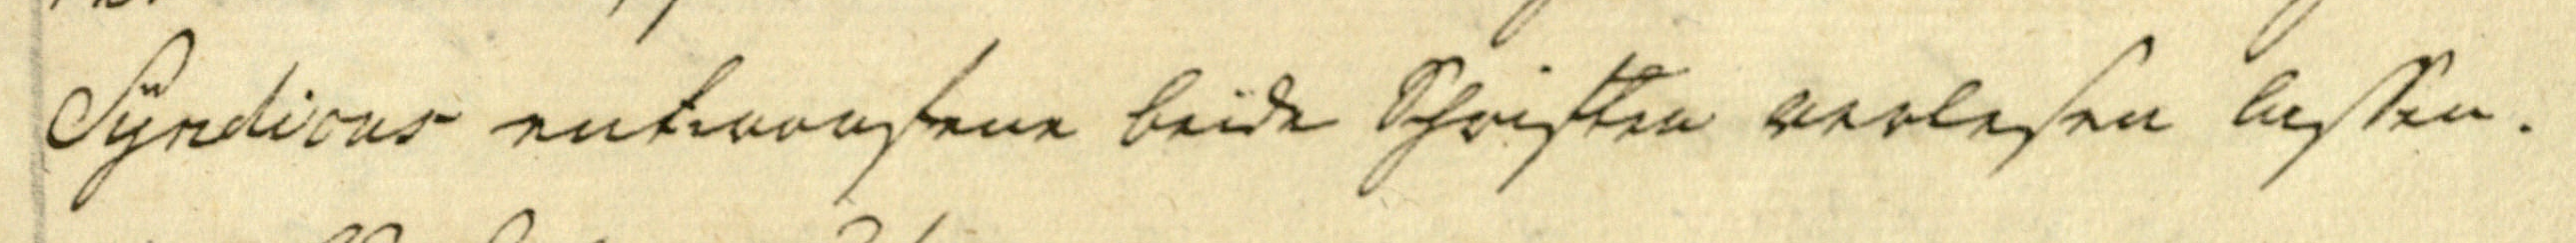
Sÿndicus entworfene beide Schriften verlesen lassen.
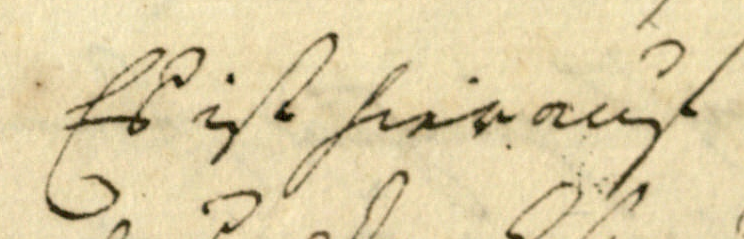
Es ist hierauf
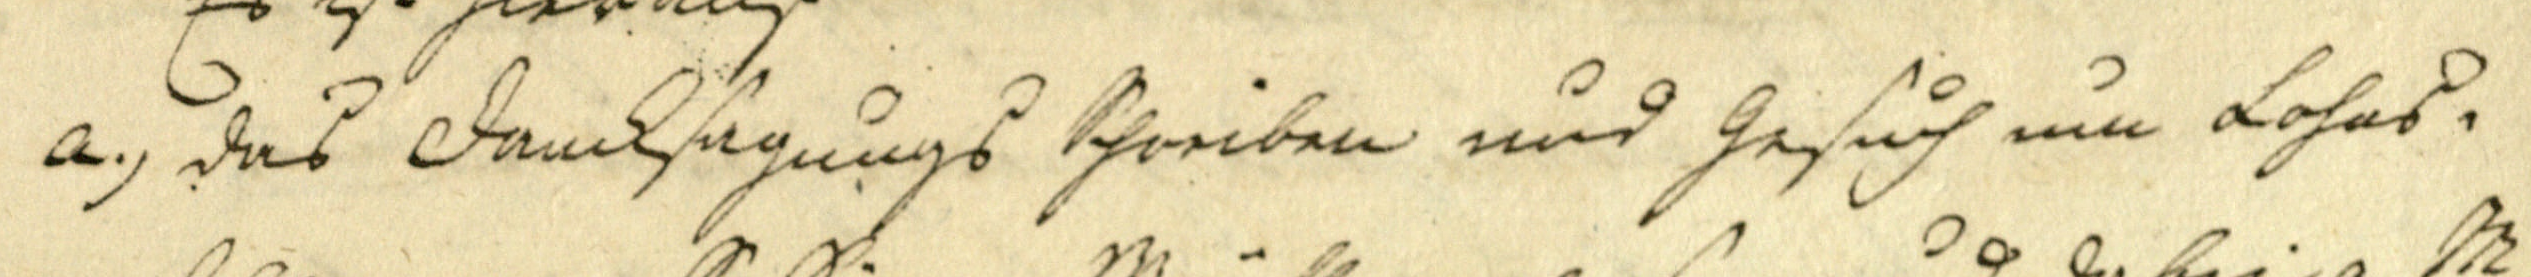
a., das Dancksagungs Schreiben und Gesuch um Lohns¬
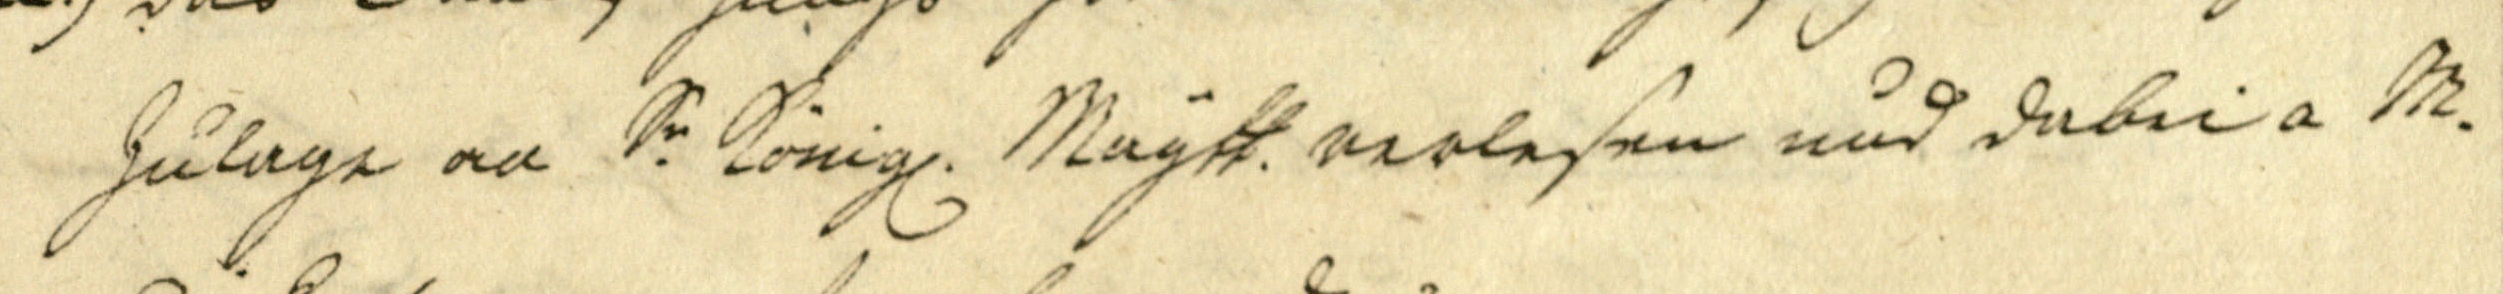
Zulage an Sr Königl. Maÿtt. verlesen und dabei a M.
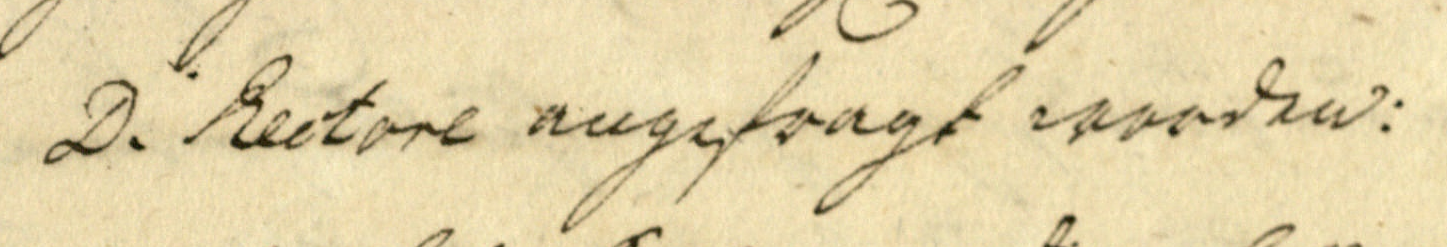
D. Rectore angefragt worden:
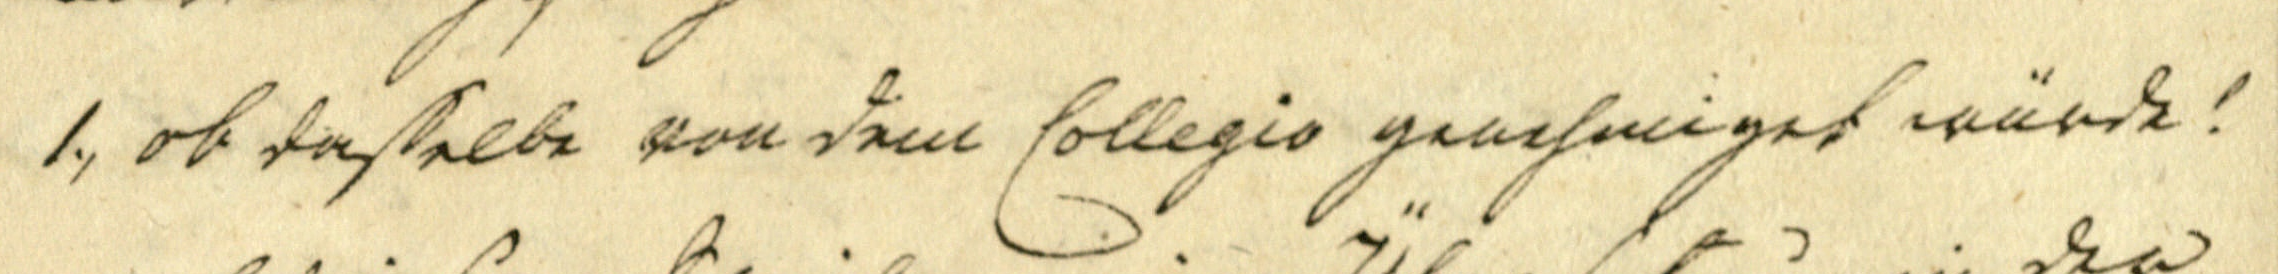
1., ob dasselbe von dem Collegio genehmiget würde?
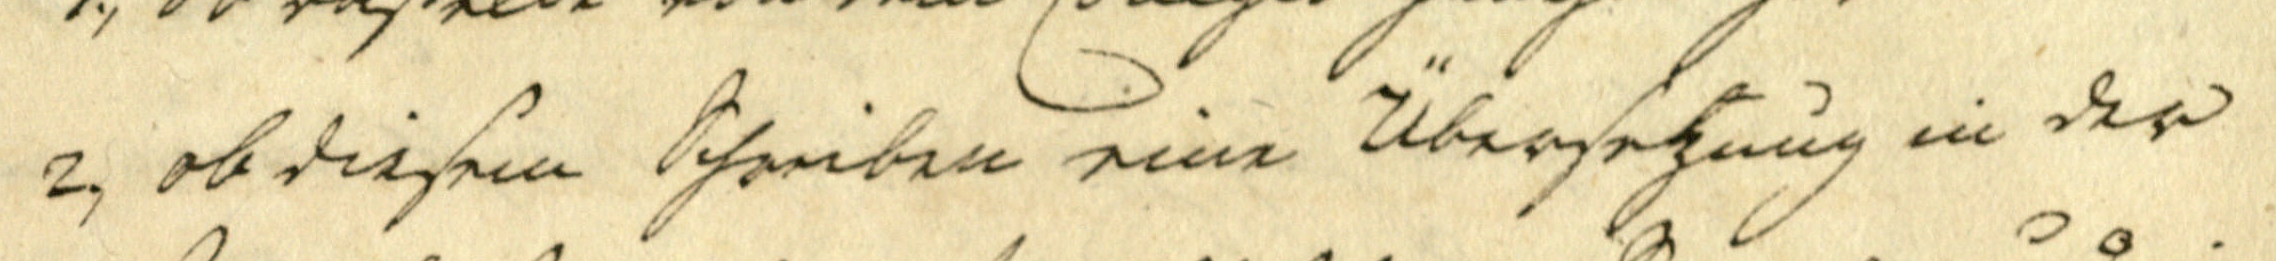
2, ob diesem Schreiben eine Übersetzung in der
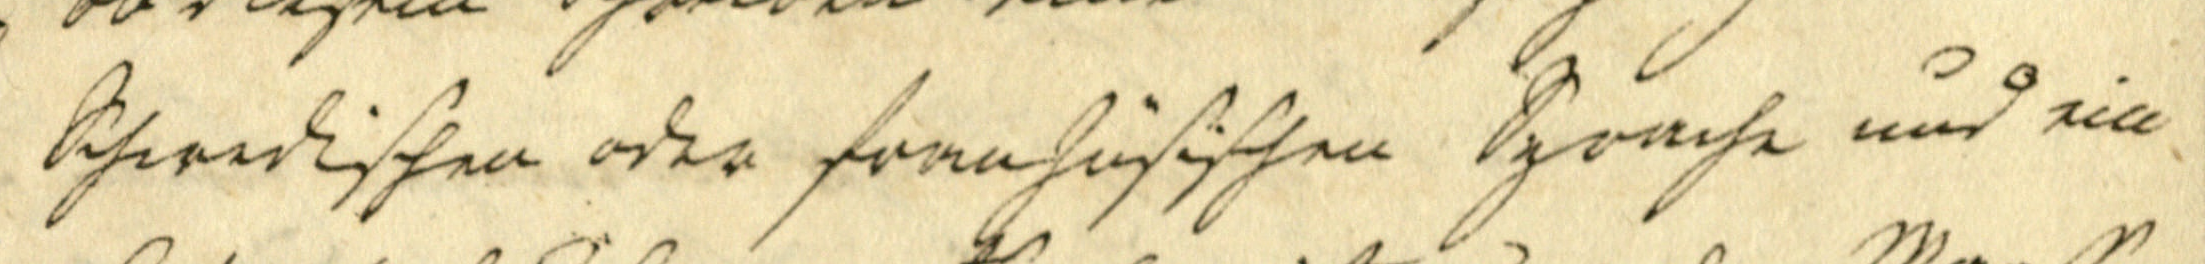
Schwedischen oder Französischen Sprache und ein
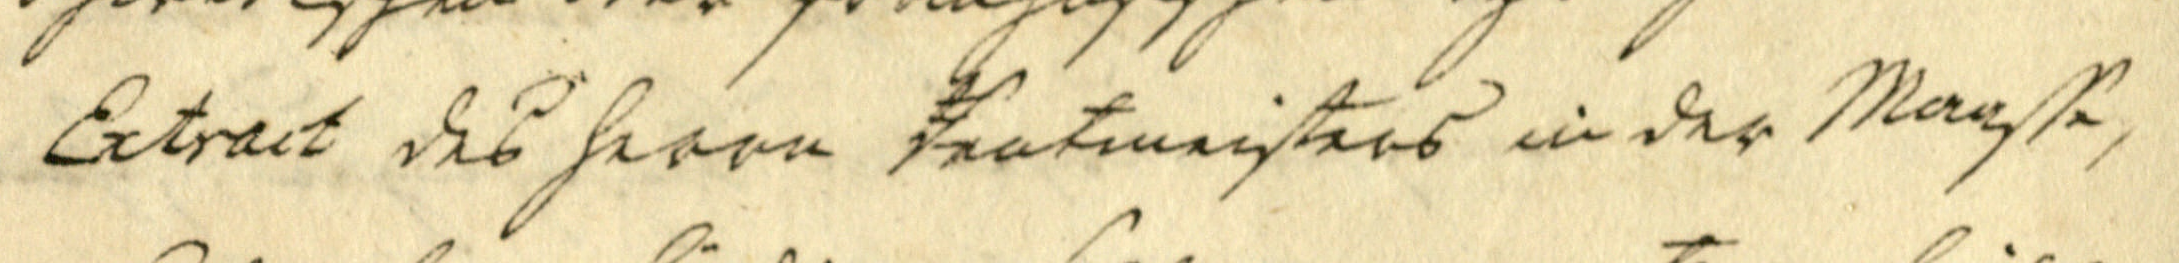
Extract des Herrn Rentmeisters in der Maasse,
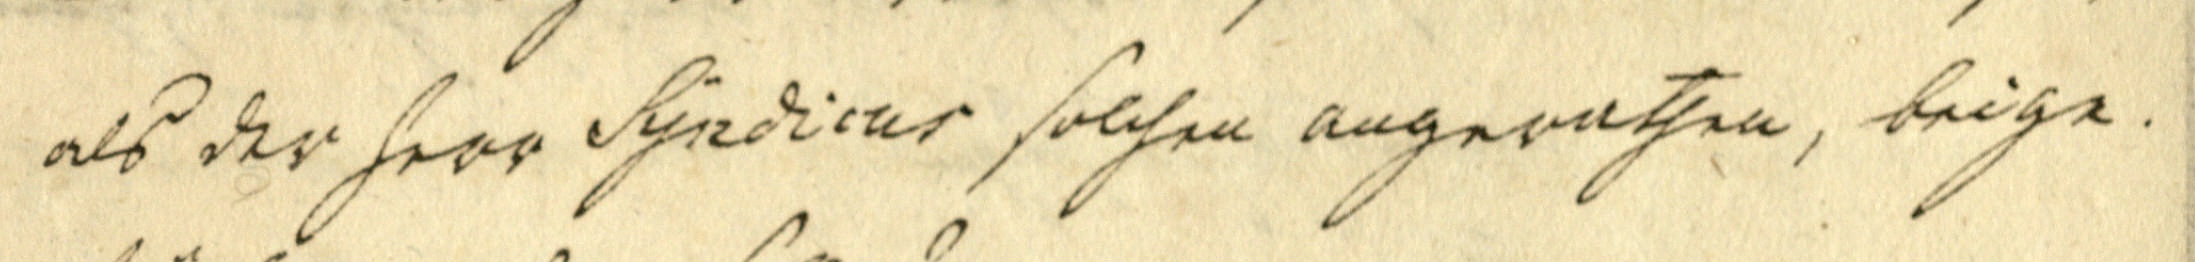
als der Herr Sÿndicus solchen angerathen, beige¬
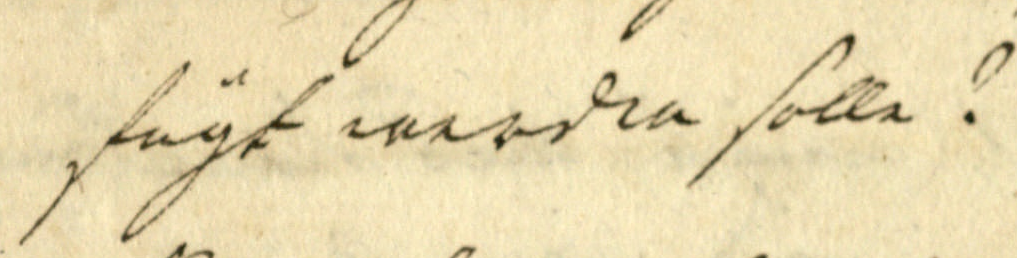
fügt werden solle?
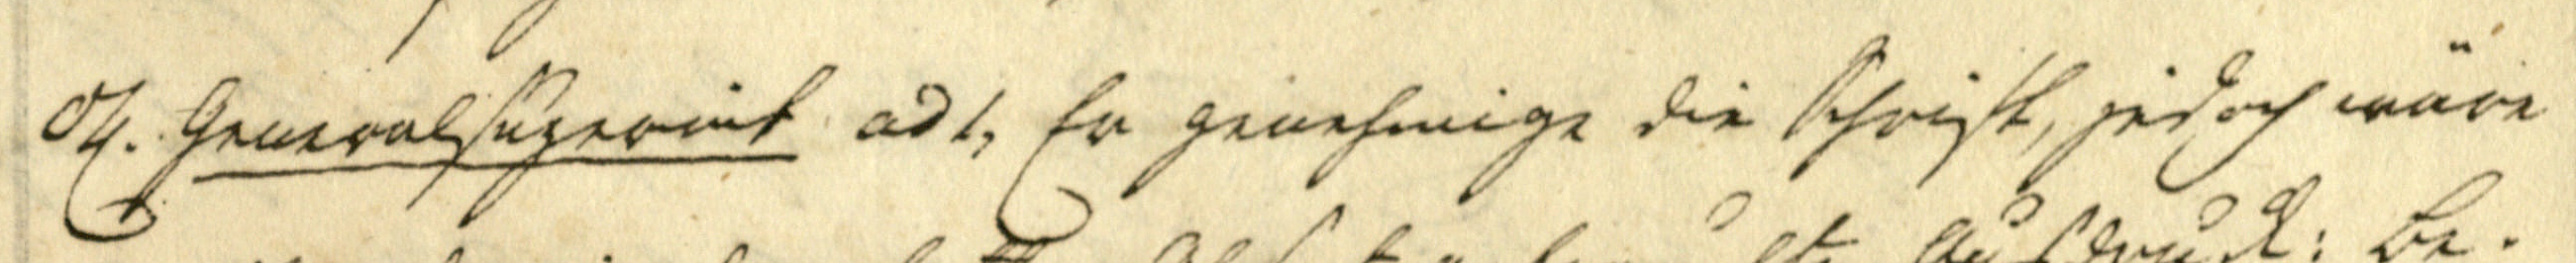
dh. Generalsuperint ad 1, Er genehmiget die Schrift, jedoch wäre
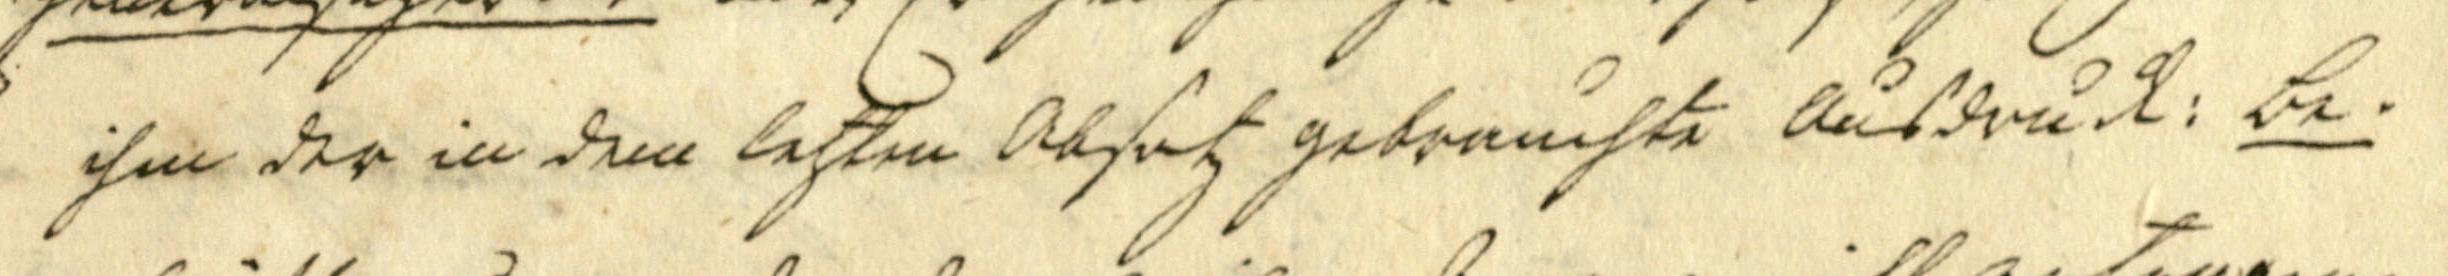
ihm der in dem letzten Absatz gebrauchte Ausdruck: Be¬
